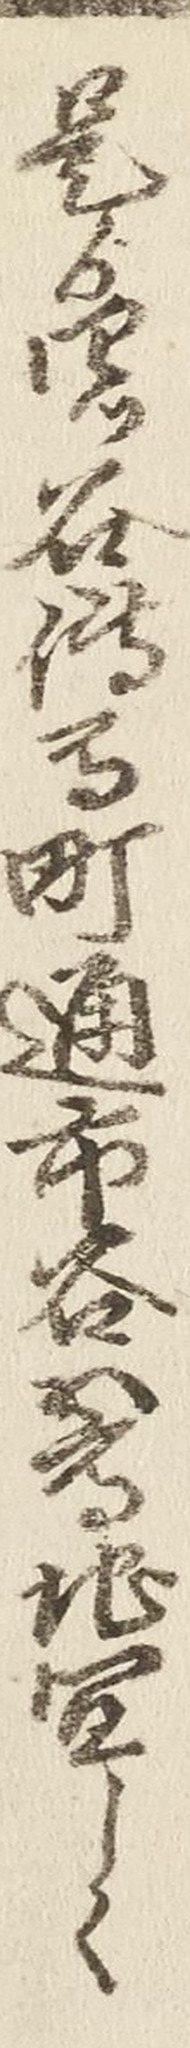是ゟ四ツ谷伝馬町通市谷は高地宜しく
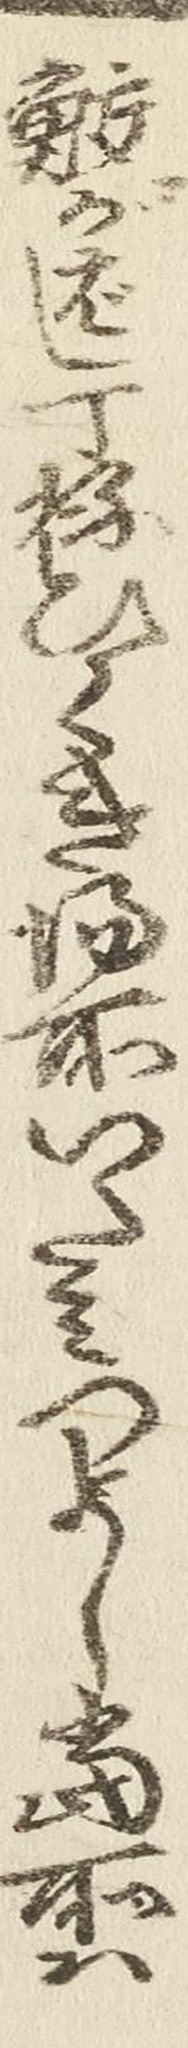鮫かばし丁抔ひくき場所いたみつよし当所は
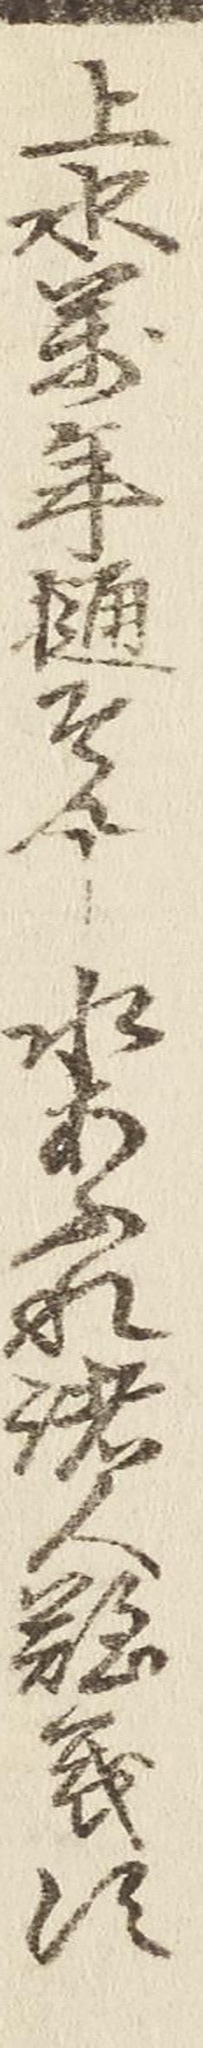上水万年樋そんし水あふれ諸人難義す
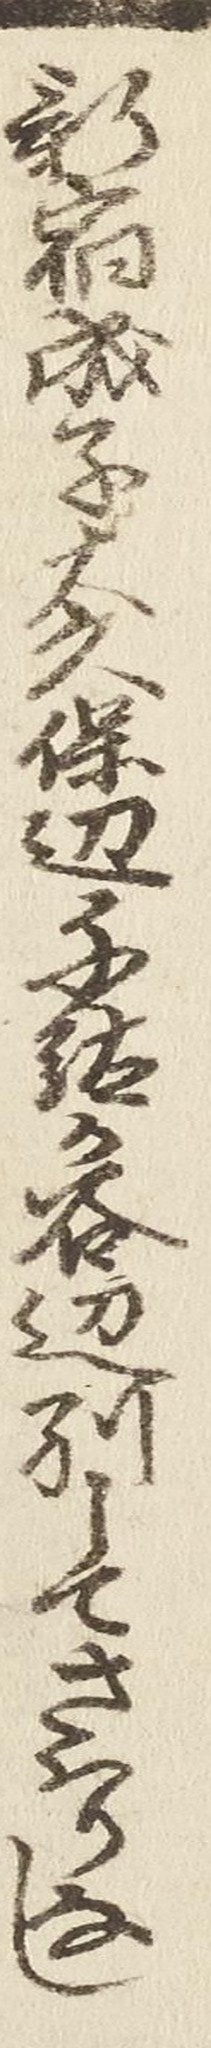新宿成子大久保辺千駄か谷辺別してさはりなし
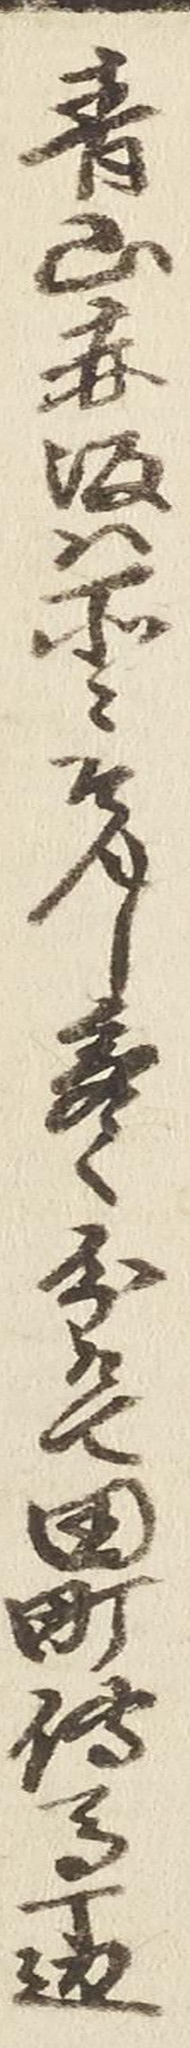青山赤坂は所々そんし多く分けて田町伝馬丁辺
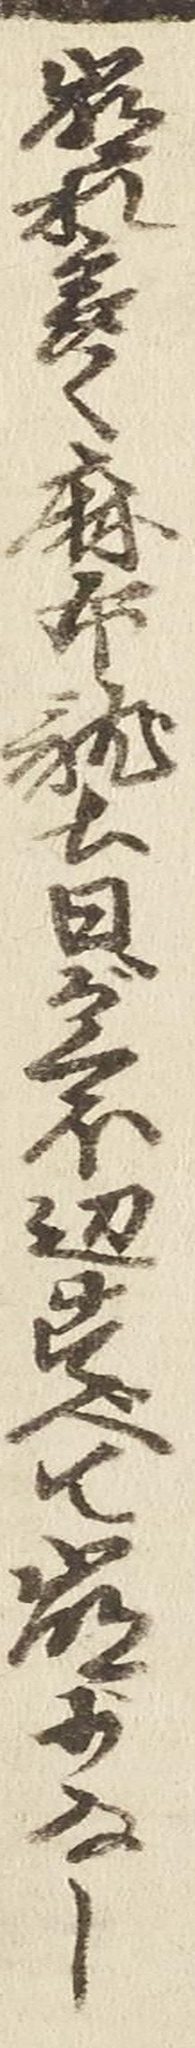崩れ多く麻布龍土日がくほ辺すべて崩少なし

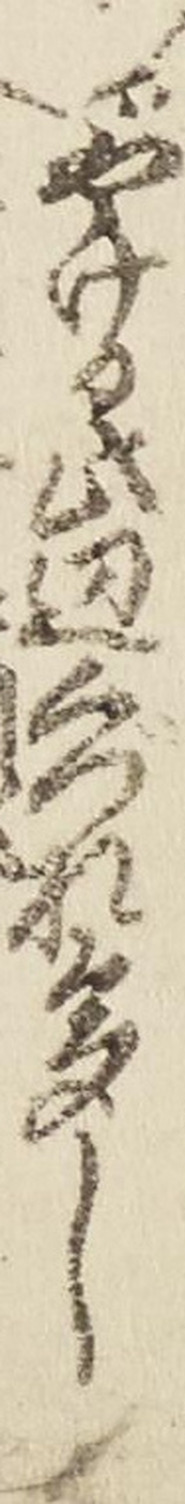やける此辺くづれ多し
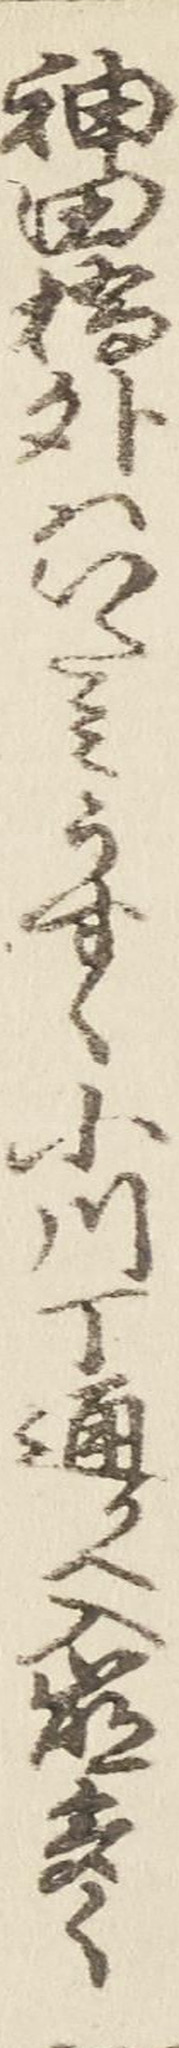神田橋外はいたみうすく小川町通りへ入崩多く
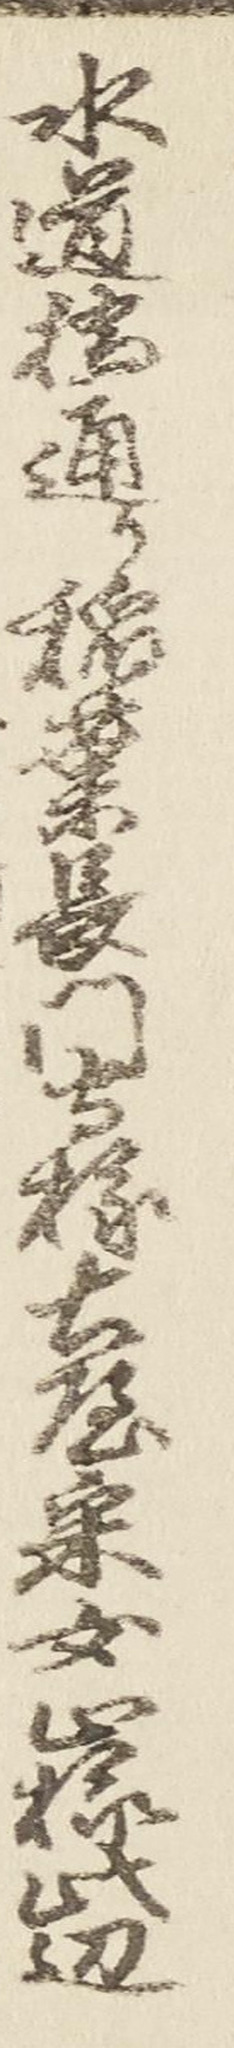水道橋通り稲葉長門守様土屋采女正様此辺
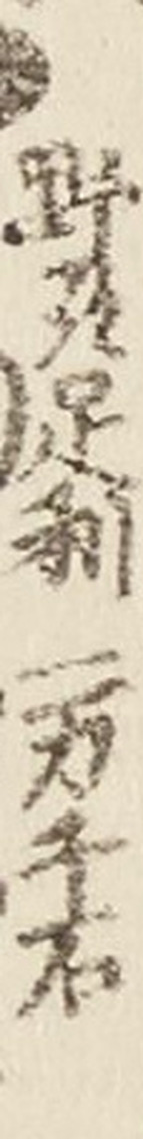野州足利一万千石
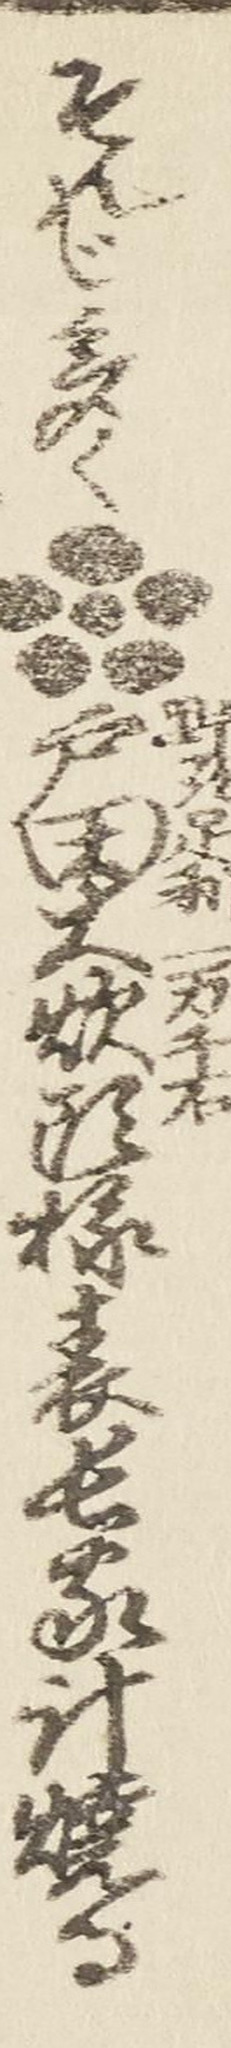そんじ多く戸田大炊頭様表長家計焼る
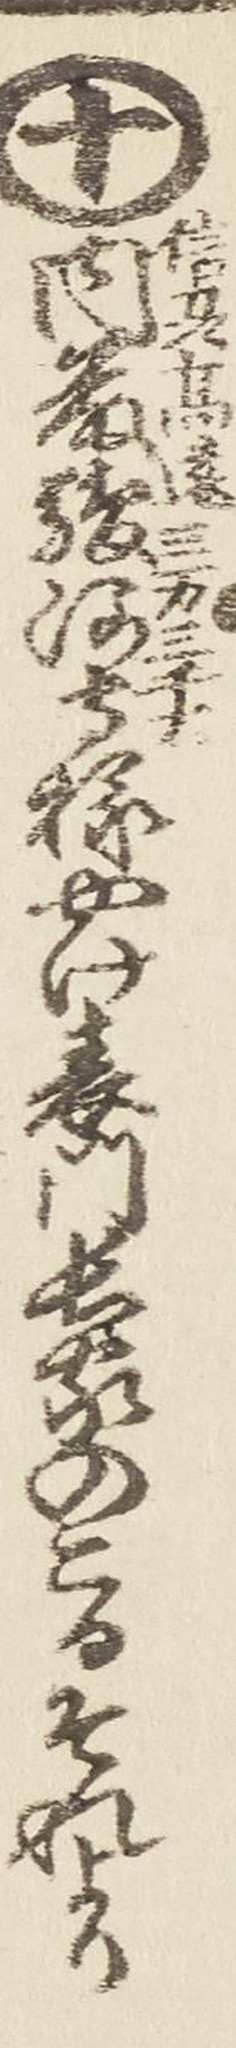内藤駿河守様やけ表門長家のこるそれより
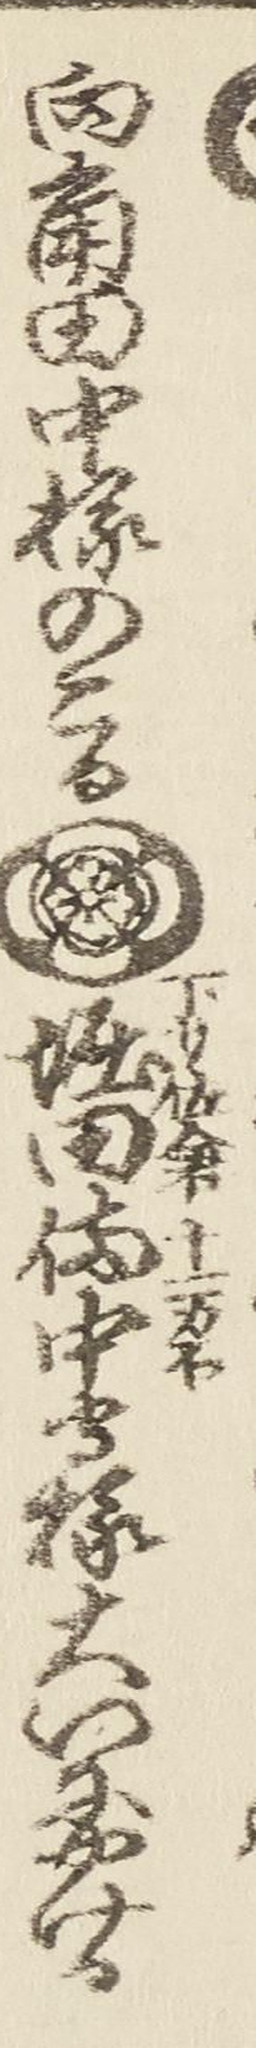向角田中様のこる堀田備中守様大いにやける
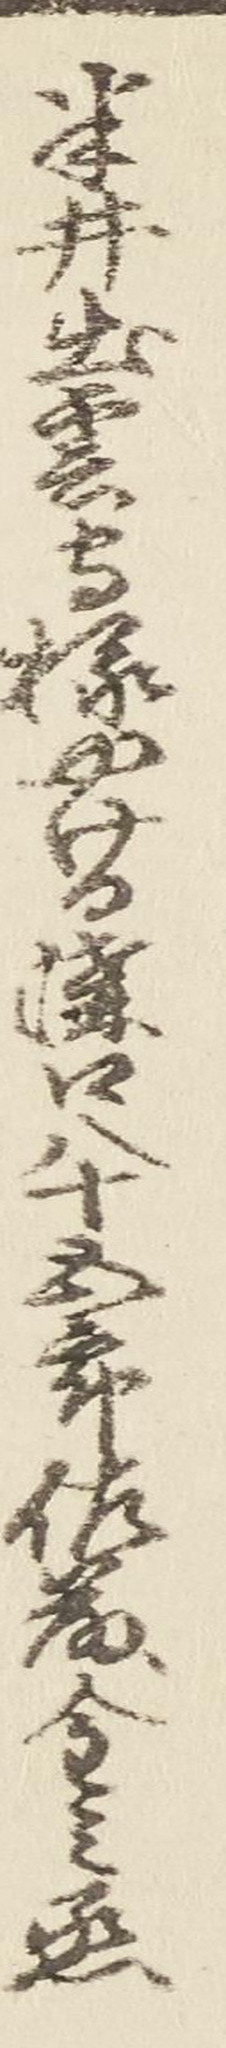半井出雲守様やける溝口八十五郎佐藤金之丞
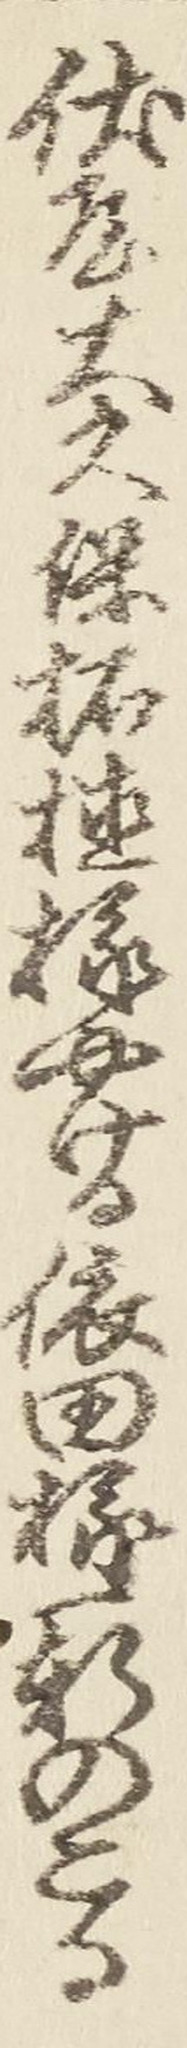伏屋大久保柘植様やける依田様軒のこる
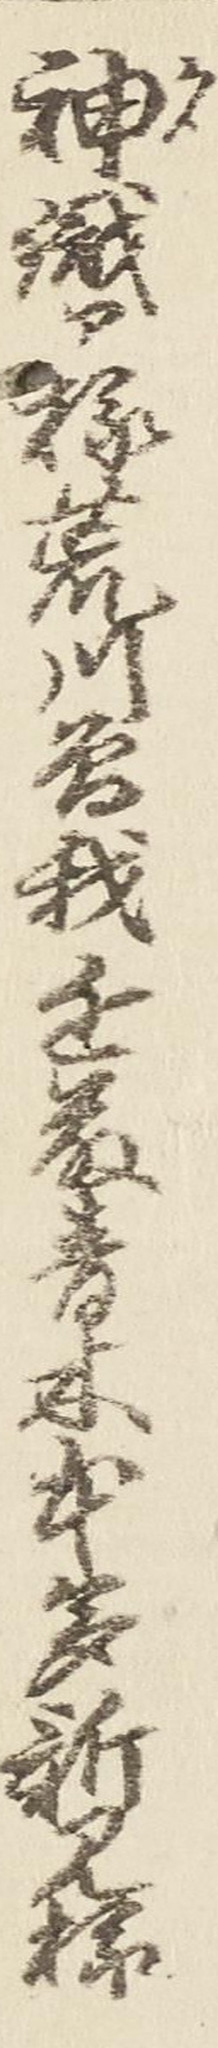神織部様荒川曽我近藤青木本多新見様
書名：江戸みやげ
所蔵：東京大学地震研究所図書室 Earthquake Research Institute Library, The University of Tokyo, JAPAN
